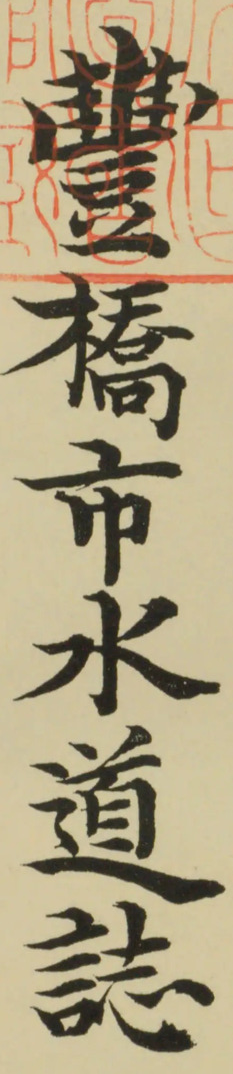豊橋市水道誌

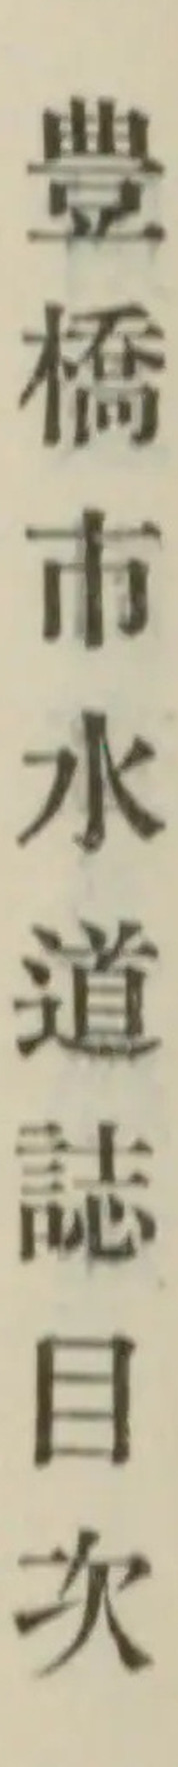豊橋市水道誌目次
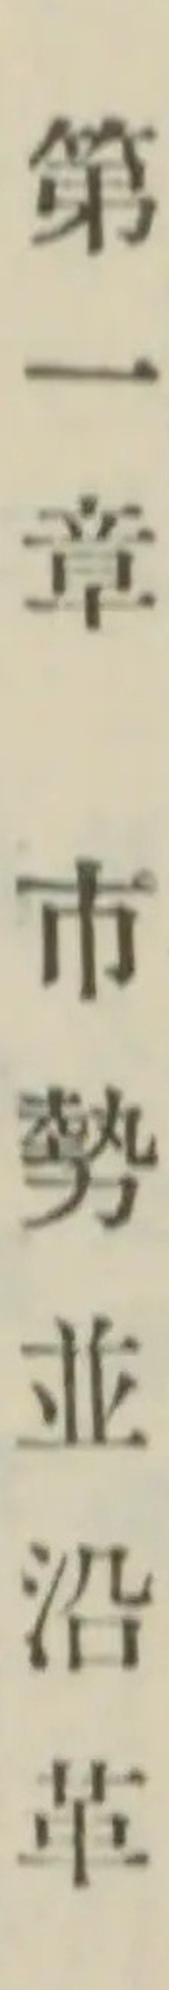第一章市勢並沿革
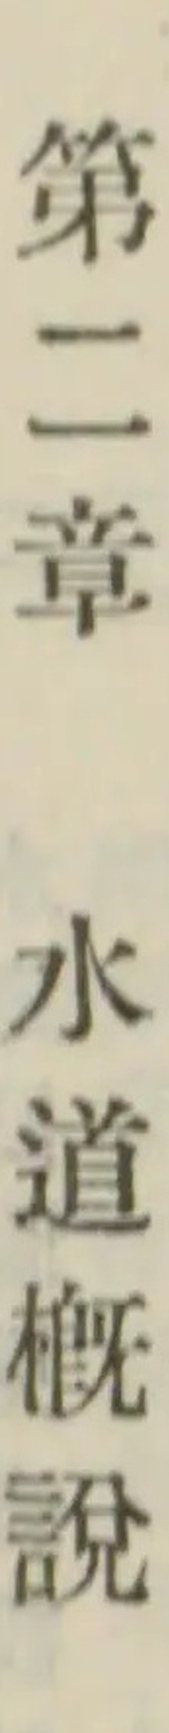第二章水道概説

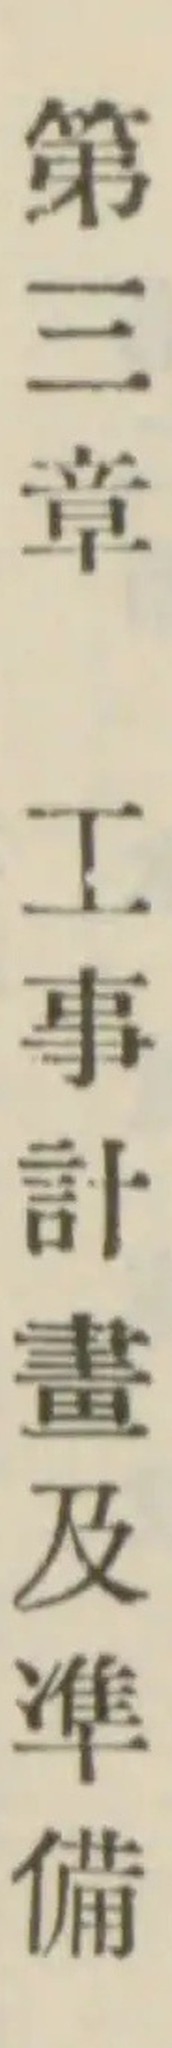第三章工事計画及準備
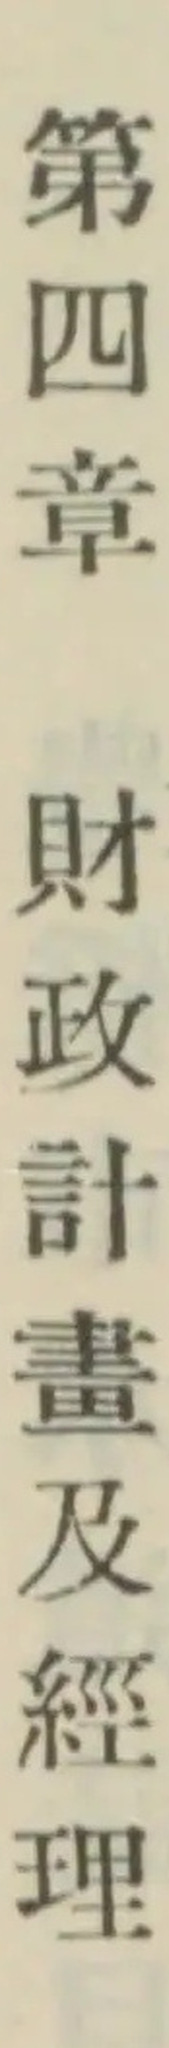第四章財政計画及経理
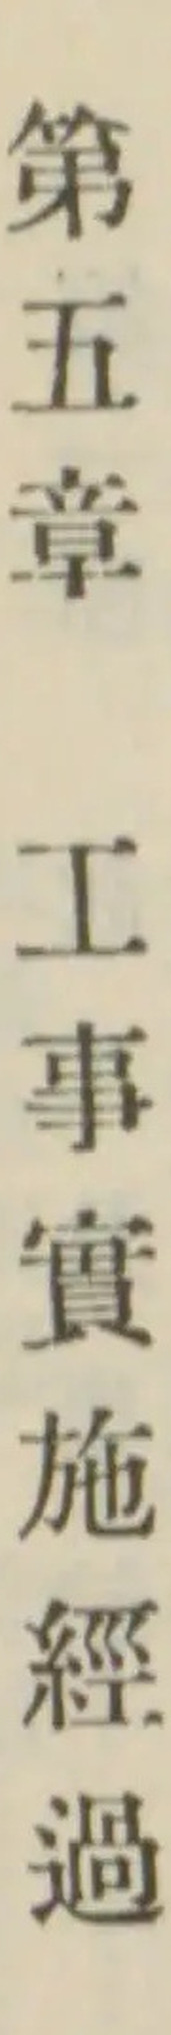第五章工事実施経過

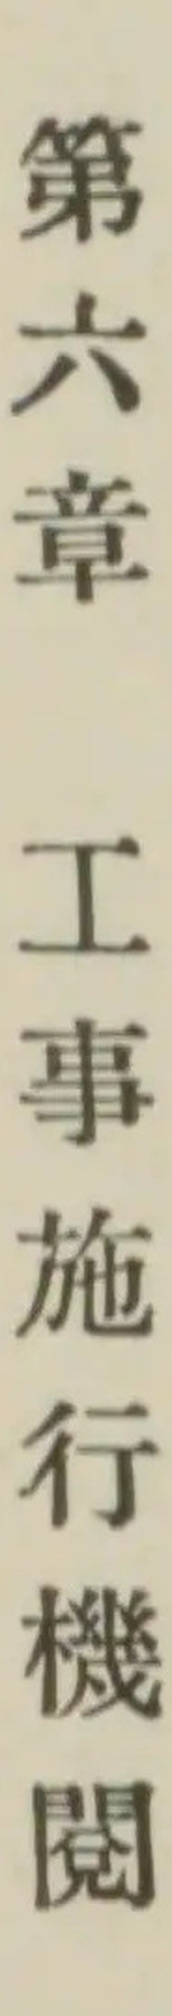第六章工事施工機関
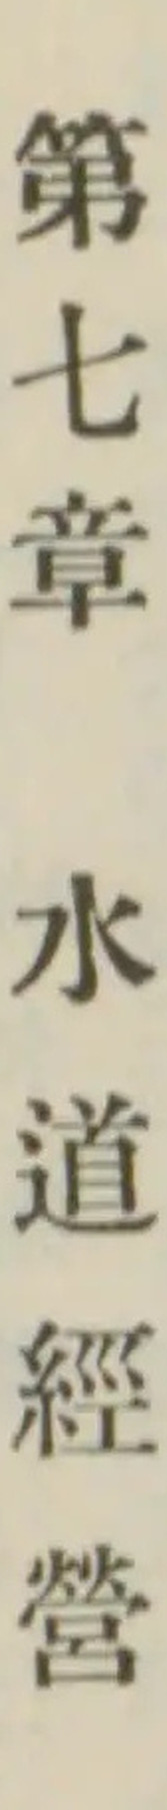第七章水道経営

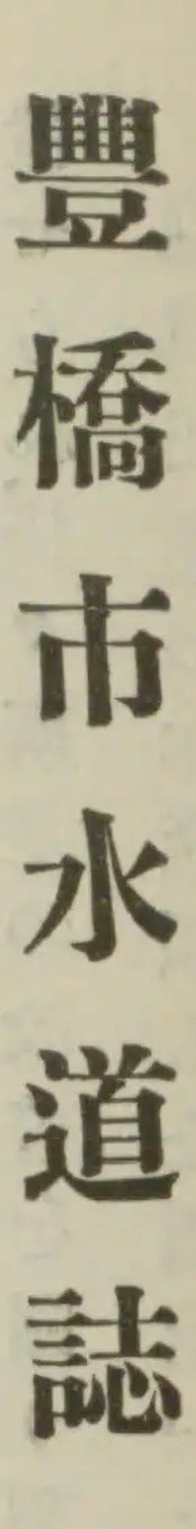豊橋市水道誌
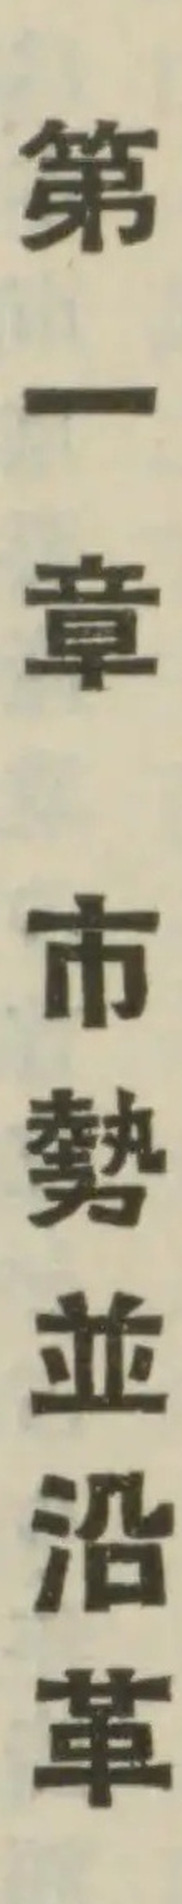第一章市勢並沿革
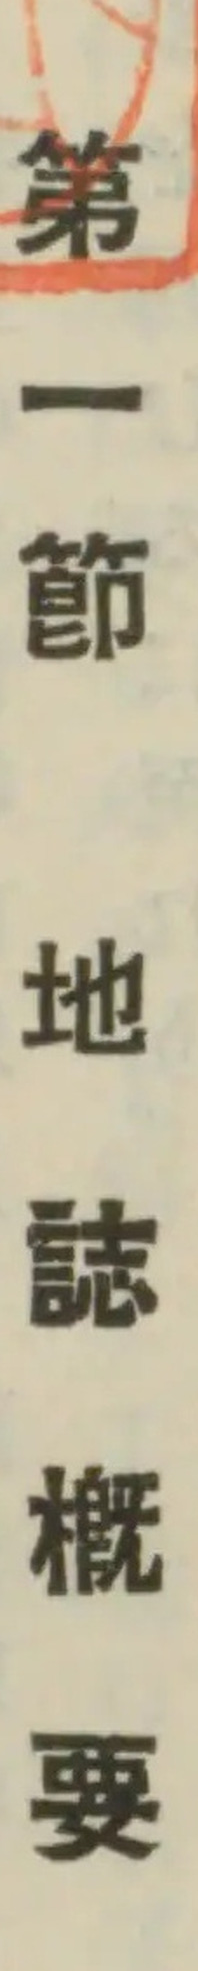第一節地誌概要
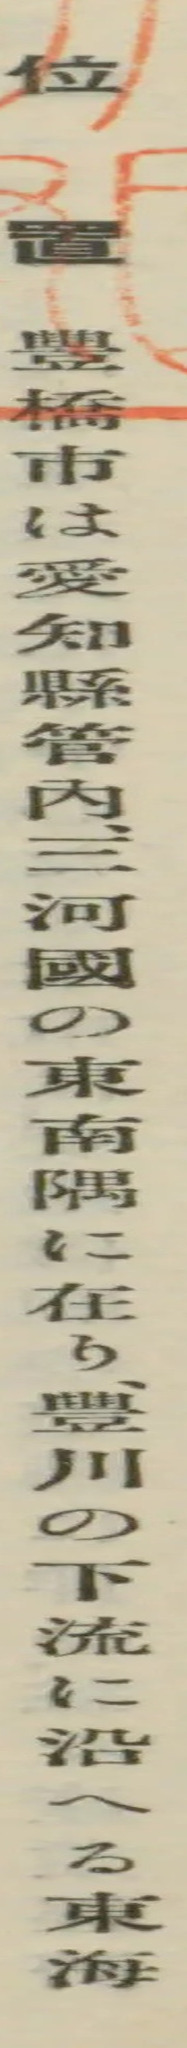位置豊橋市は愛知県管内三河国の東南隅に在り、豊川の下流に沿える東海
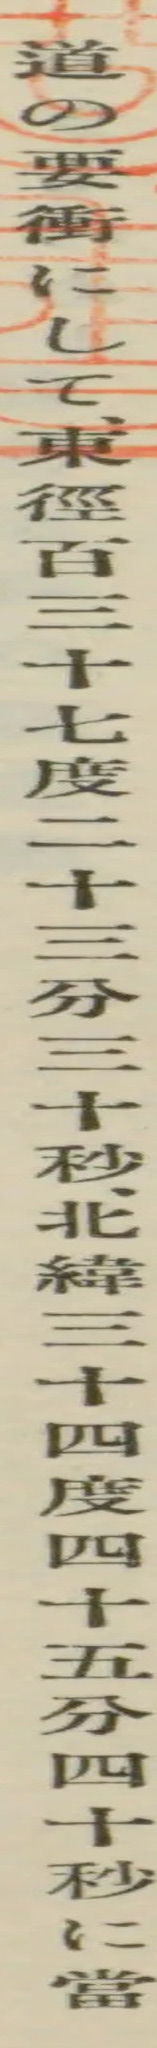道の要衝にして、東経百三十七度二十三分三十秒、北緯三十四度し四十五分四十秒に当
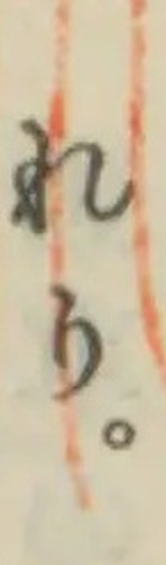れり。
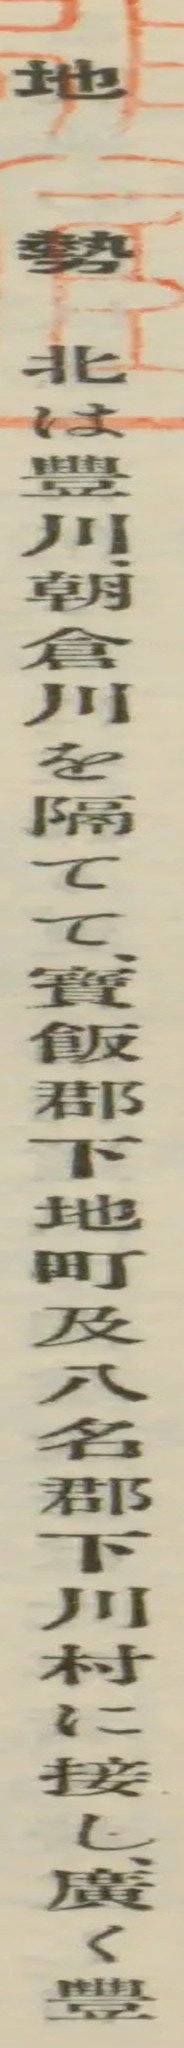地勢北は豊川、朝倉川をへだてて隔てて、寶飯郡下地町及八名郡下川村に接し、広く豊
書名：豊橋市水道誌
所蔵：国立国会図書館 National Diet Library, JAPAN
